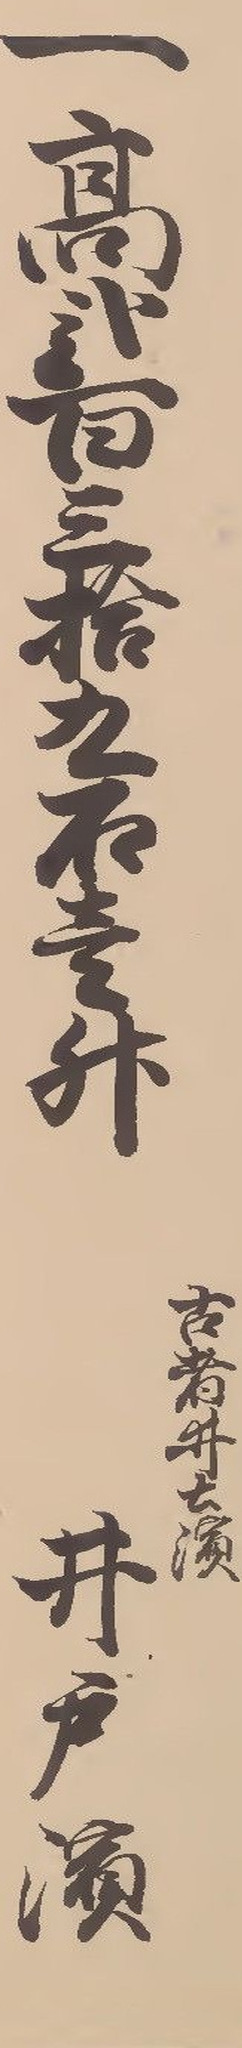一高弐百三拾九石壱升井戸浜
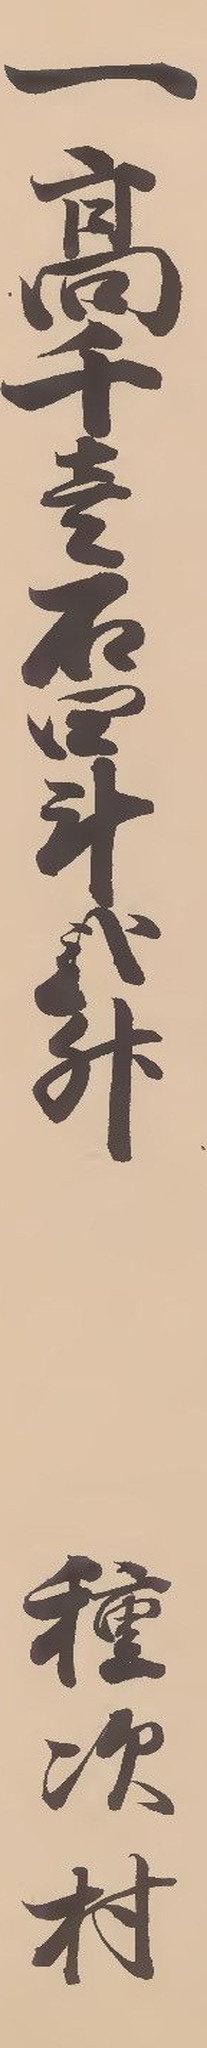一高千壱石四斗弐升種次村
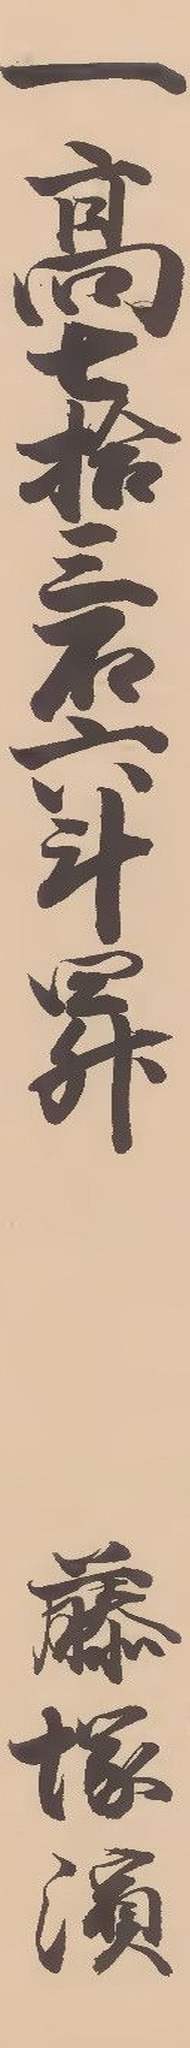一高七拾三石六斗四升藤塚浜
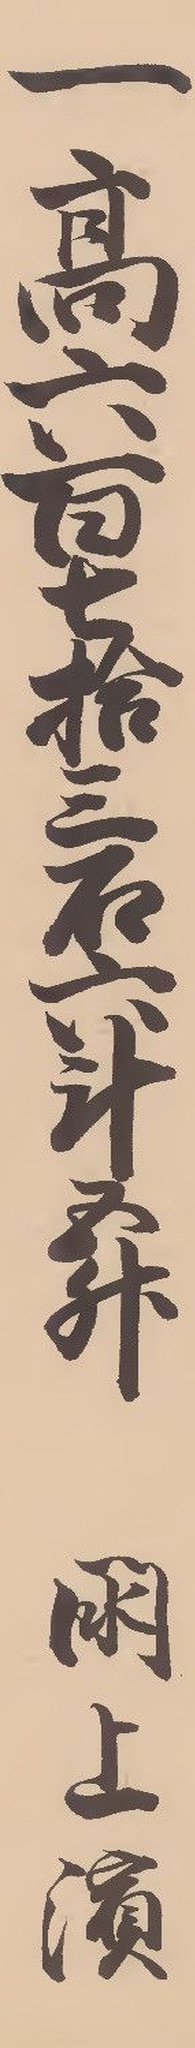一高六百七拾三石六斗五升閖上浜

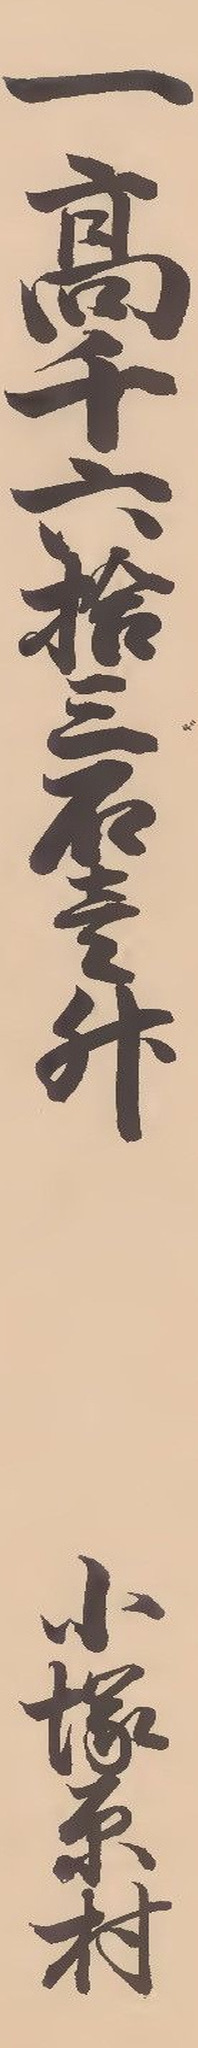一高千六拾三石壱升小塚原村
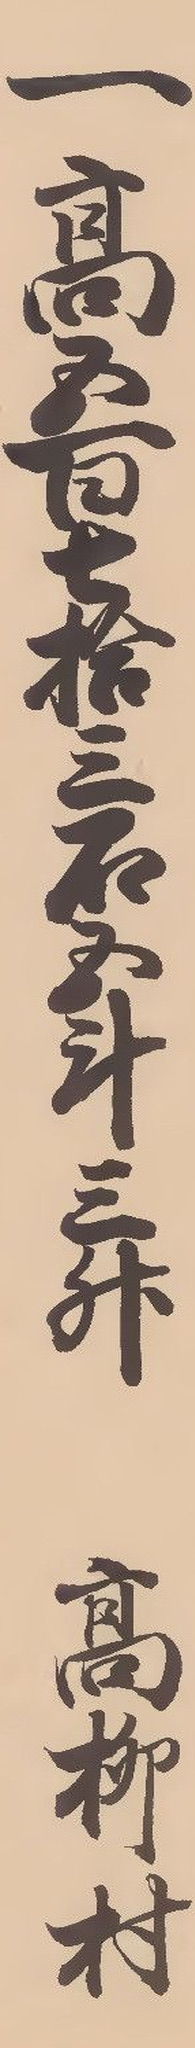一高五百七拾三石五斗三升高柳村
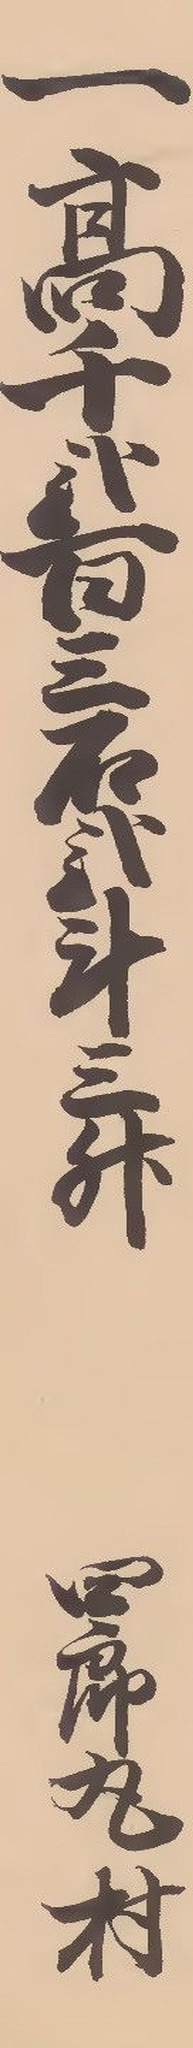一高千弐百三石弐斗三升四郎丸村
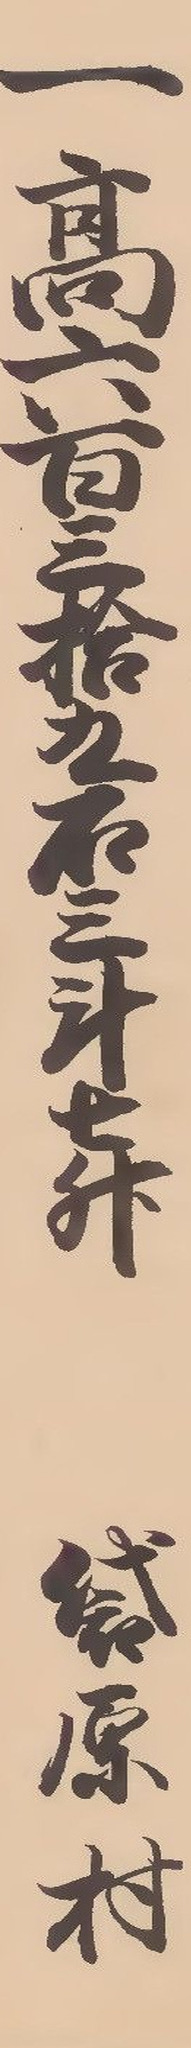一高六百三拾九石三斗七升袋原村
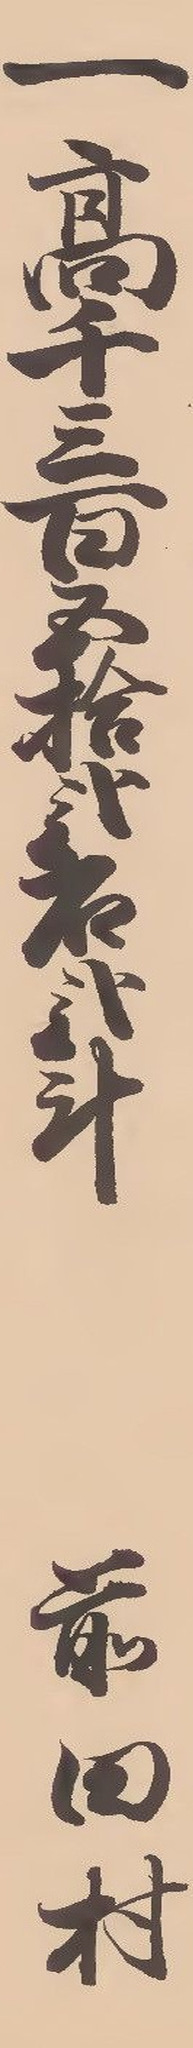一高千三百五拾弐石弐斗前田村
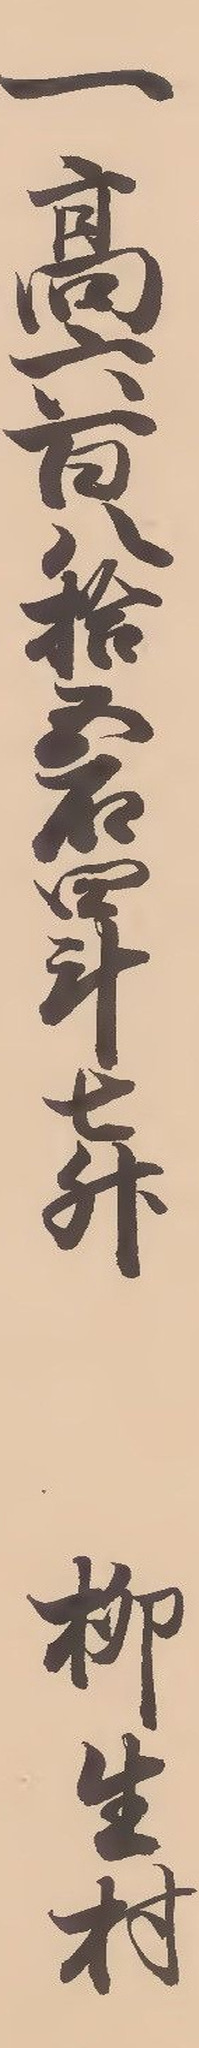一高六百八拾五石四斗七升柳生村
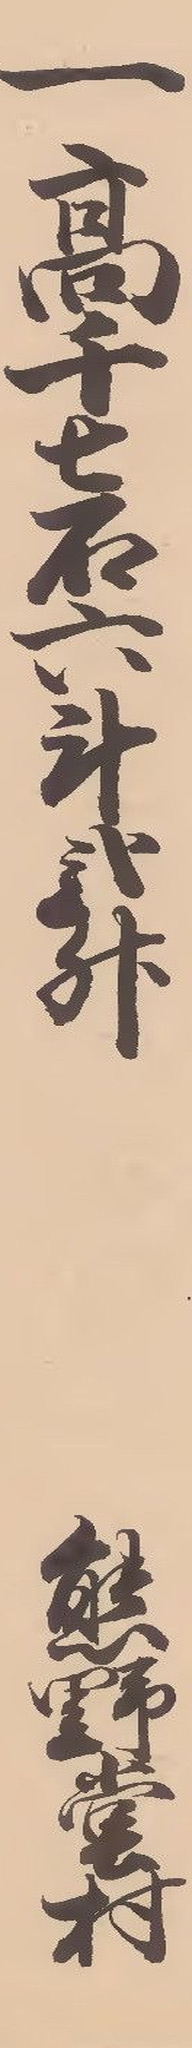一高千七石六斗弐升熊野堂村
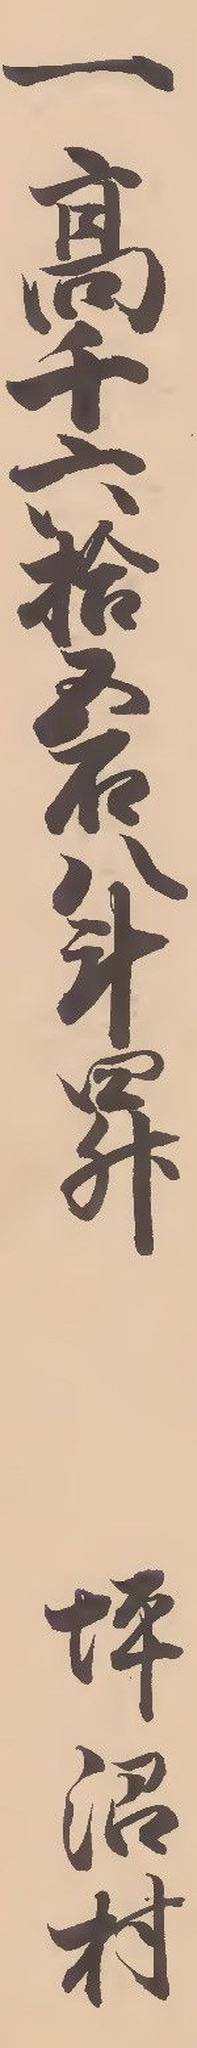一高千六拾五石八斗四升坪沼村

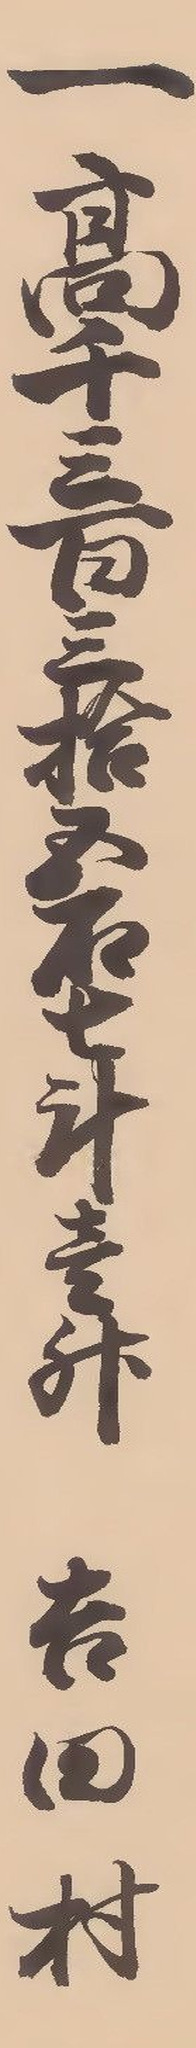一高千三百三拾五石七斗壱升吉田村
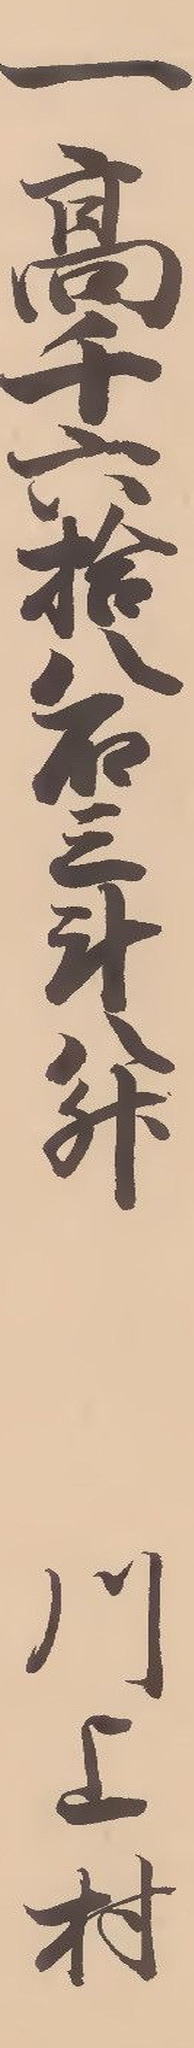一高千六拾八石三斗八升川上村
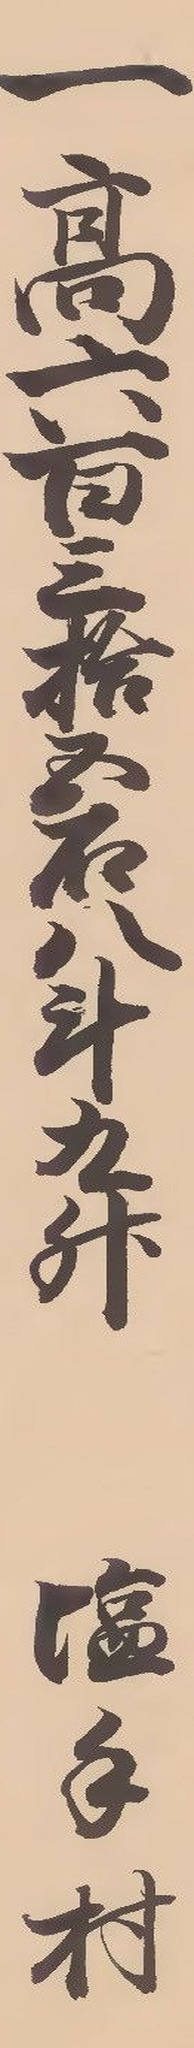一高六百三拾五石八斗九升塩手村
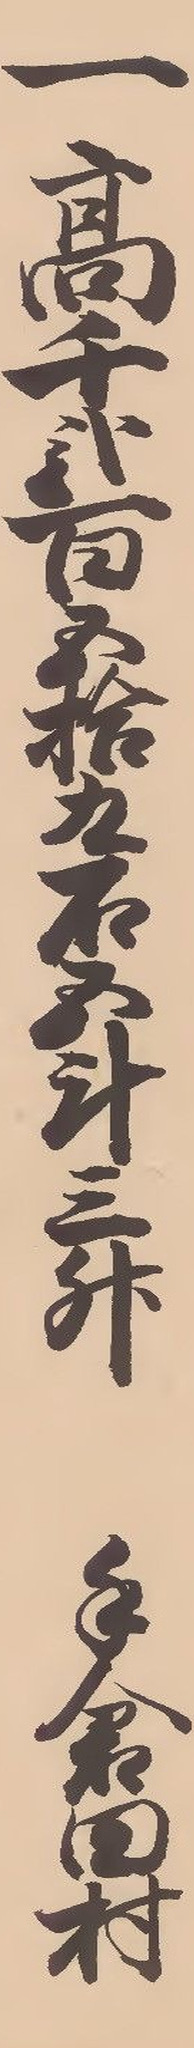一高千弐百五拾九石五斗三升手倉田村
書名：陸奥国郷帳　５
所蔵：国立公文書館 National Archives of Japan
